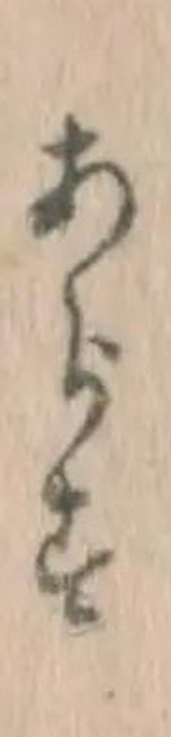あらす

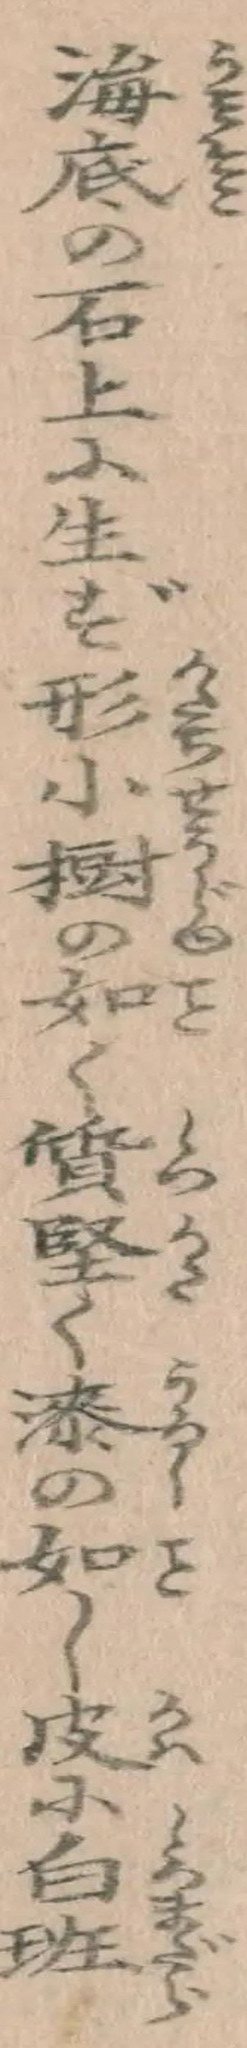海底の石上に生ず形小樹の如く質堅く漆の如し皮に白班

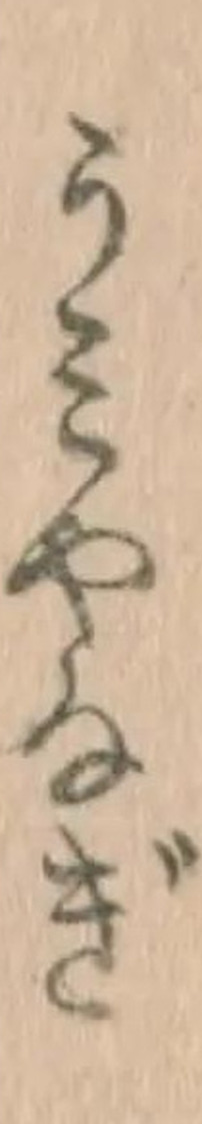うみやなぎ
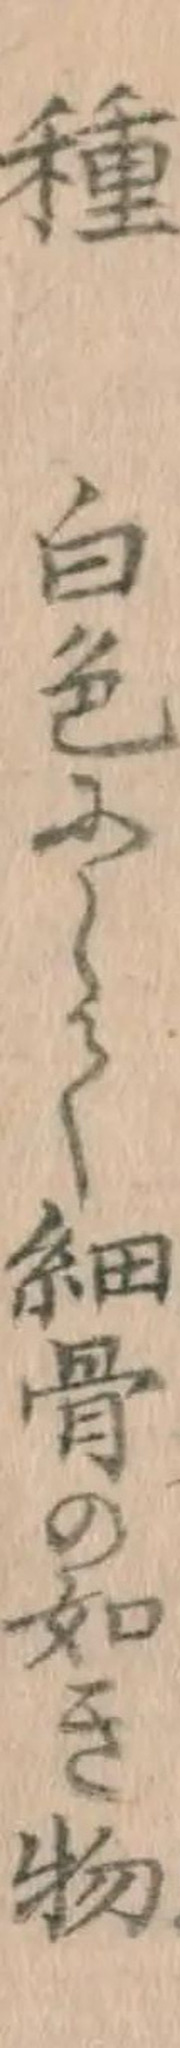一種白色にして細骨の如き物
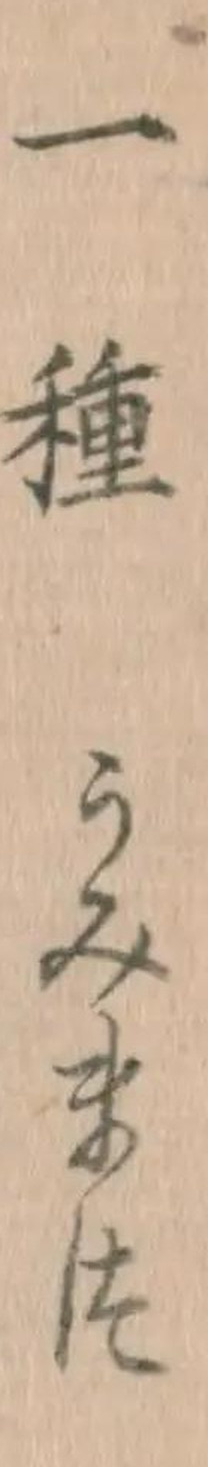一種うみまつ
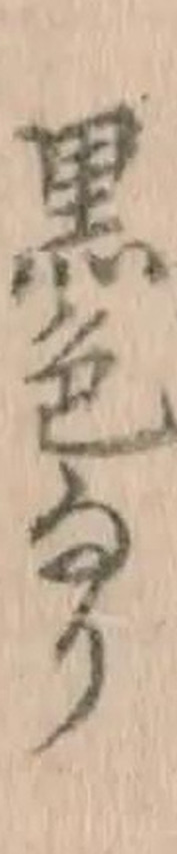黒色なり

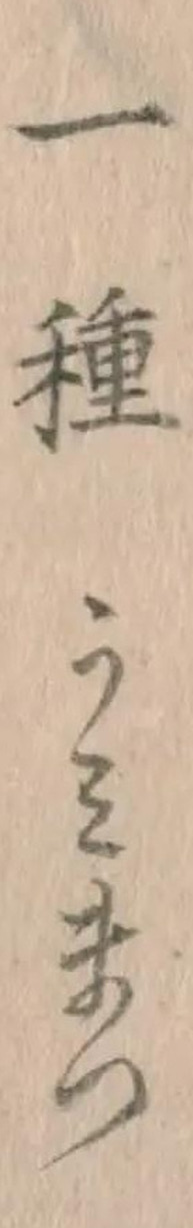一種うみまつ
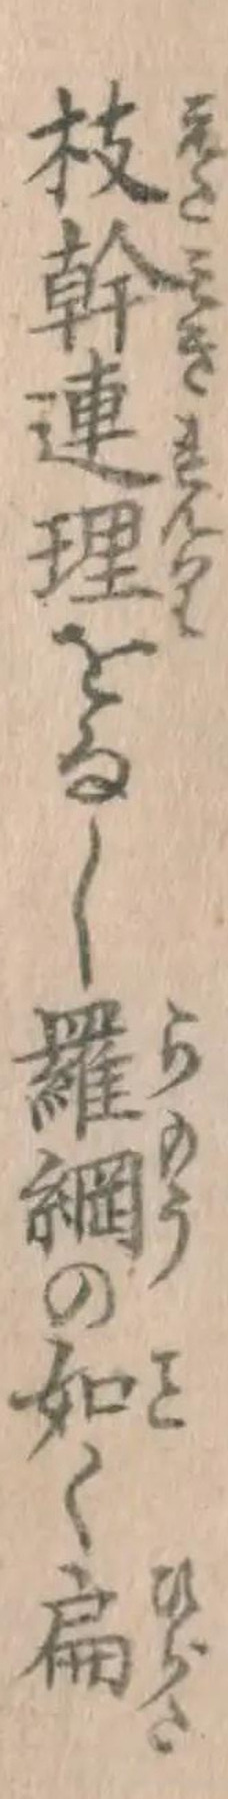枝幹連理をなし羅網の如く扁
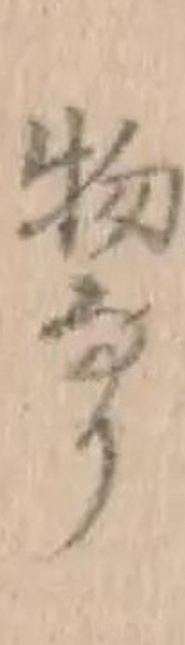物なり

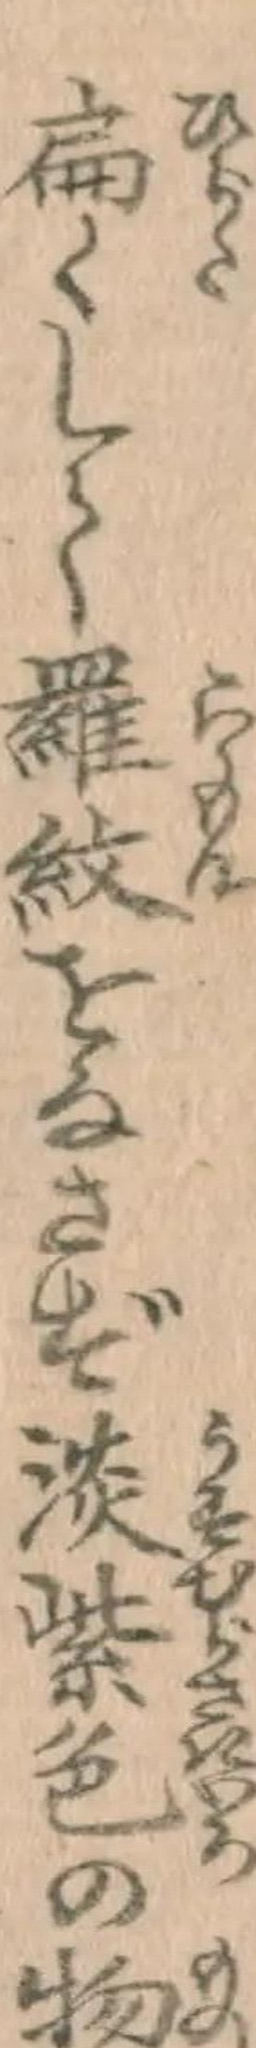扁くして羅紋をなさず淡紫色の物

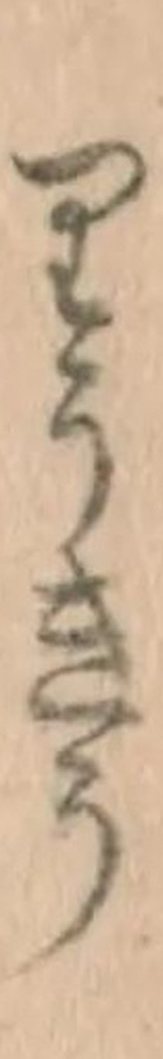りうきう
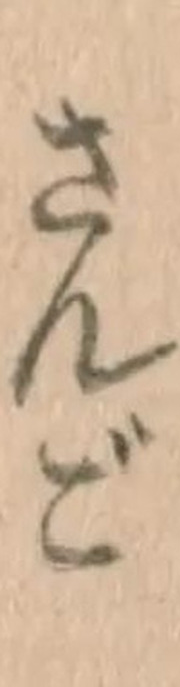さんご
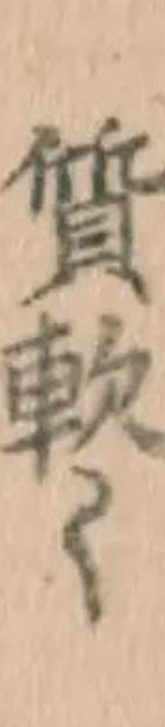質軟く
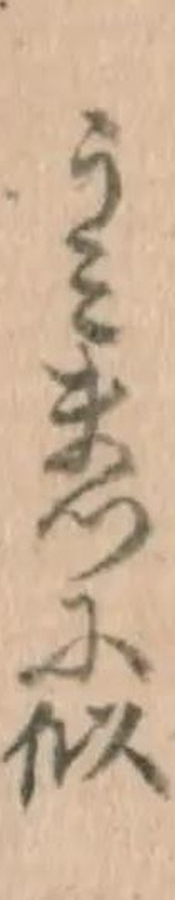うみまつに似
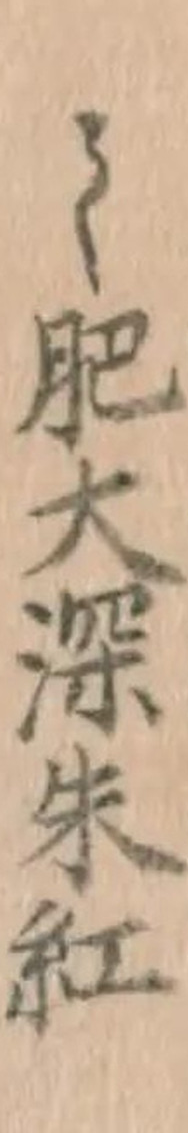て肥大深朱紅
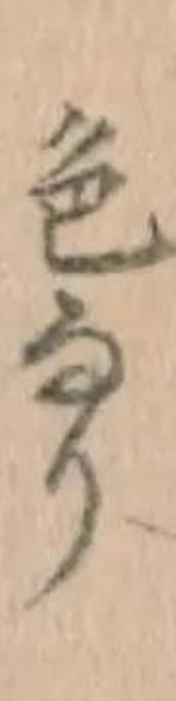色なり
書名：本草図譜. 巻34-36
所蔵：国立国会図書館 National Diet Library, JAPAN
